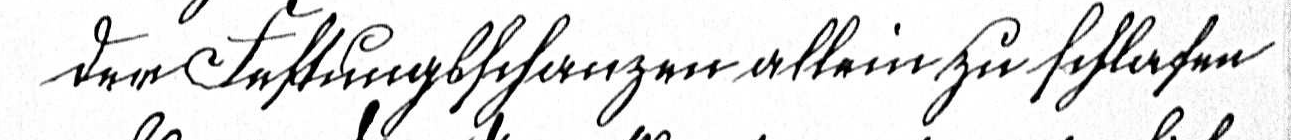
der Festungsschanzen allein zu schlafen
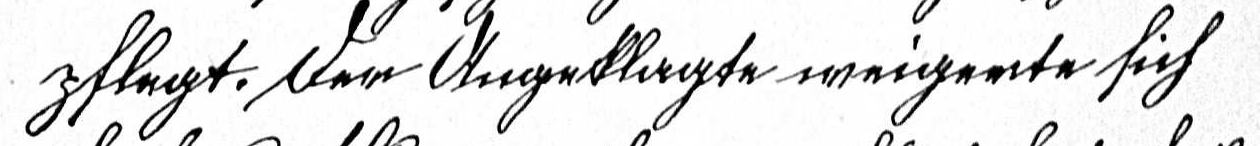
pflegt. Der Angeklagte weigerte sich
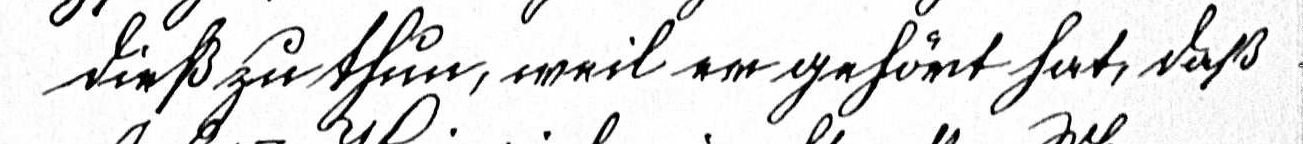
dieß zu thun, weil er gehört hat, daß
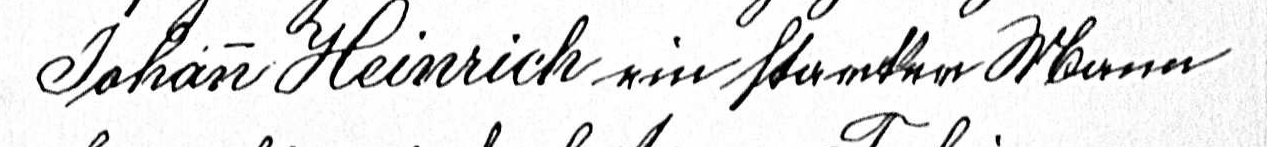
Johann Heinrich ein starker Mann
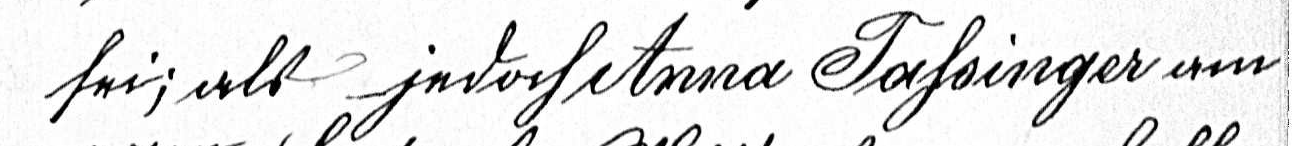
sei; als jedoch Anna Tassinger am
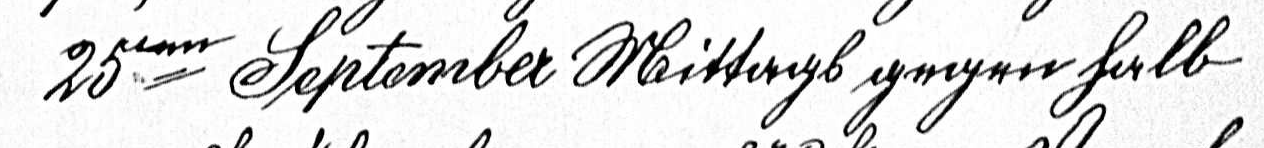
25en September Mittags gegen halb
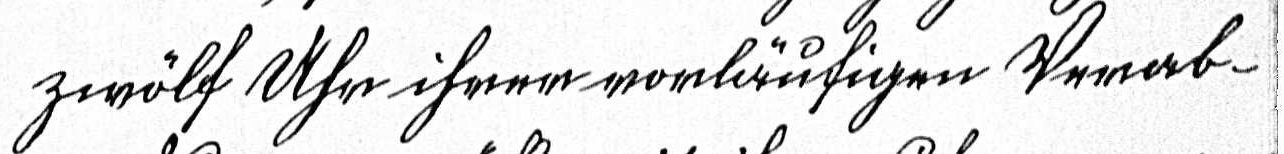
zwölf Uhr ihrer vorläufigen Verab¬
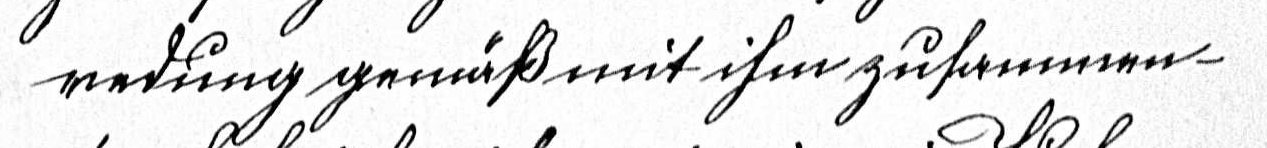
redung gemäß mit ihm zusammen¬
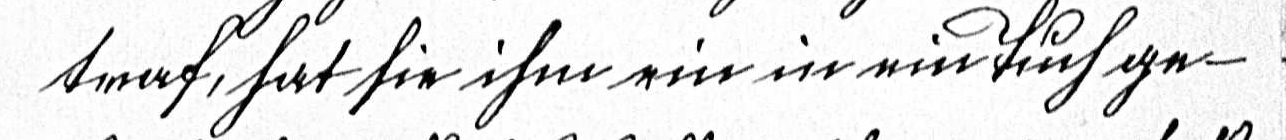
traf, hat sie ihm ein in ein Tuch ge¬
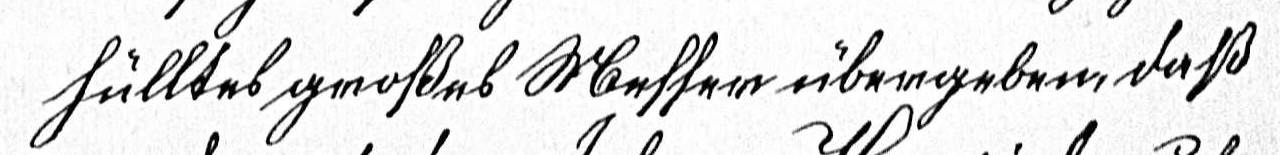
hülltes großes Messer übergeben, daß
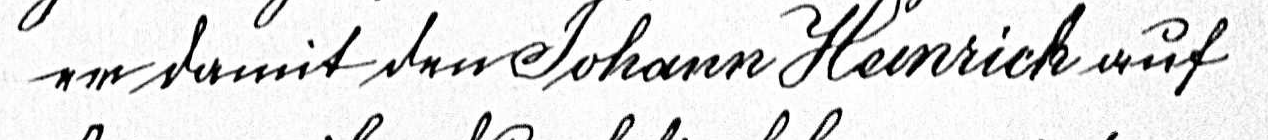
er damit den Johann Heinrich auf
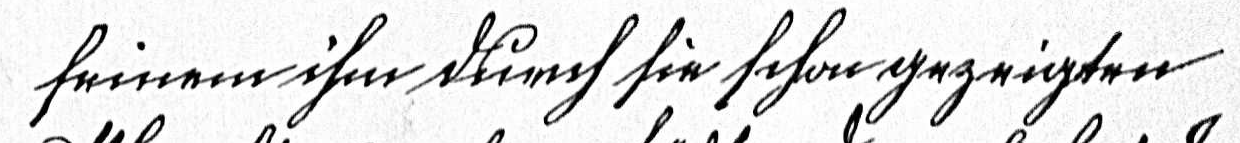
seinem ihm durch sie schon gezeigten
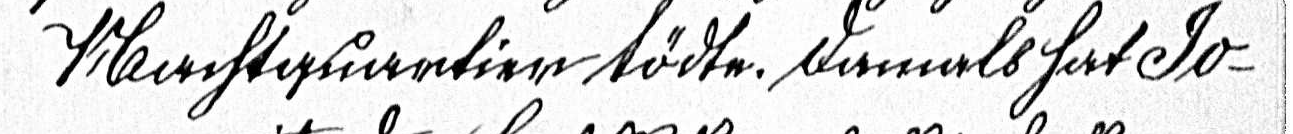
Nachtquartier tödte. Damals hat Jo¬
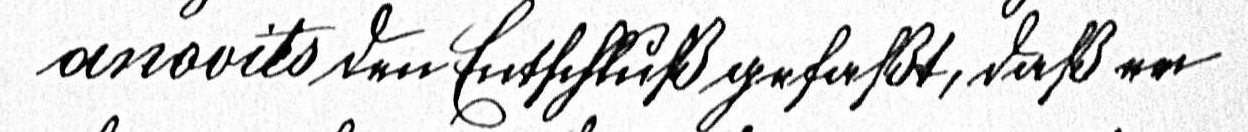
anovits den Entschluß gefaßt, daß er
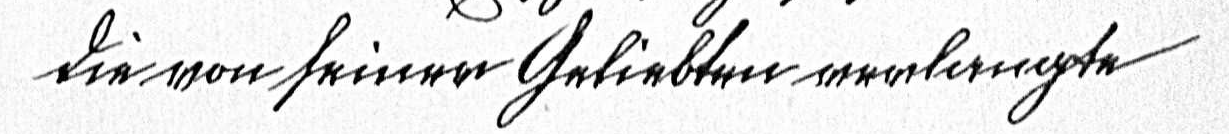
die von seiner Geliebten verlangte
